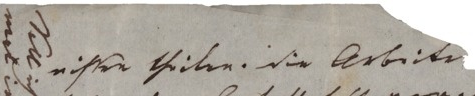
würden dann im Resul-
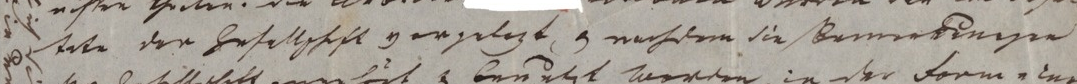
tate der Gesellschaft vorgelegt & nachdem die Bemerkungen
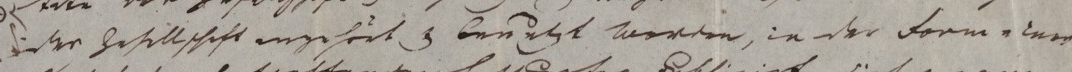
in der Gesellschaft angehört & benutzt worden, in der Form einer
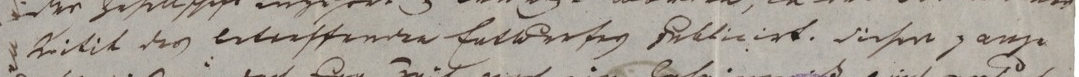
Kritik des betreffenden Entwurfes publicirt. Dieser ganze
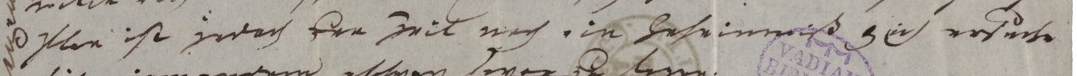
Plan ist jedoch zur Zeit noch ein Geheimniß & ich ersuche
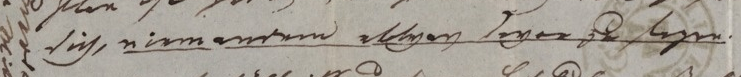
dich, niemandem etwas davon zu sagen.
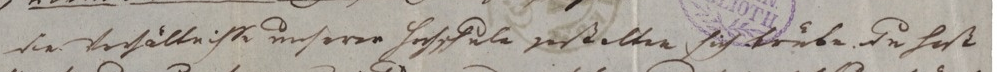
Die Verhältnisse unserer Hochschule gestalten sich trübe. Du hast
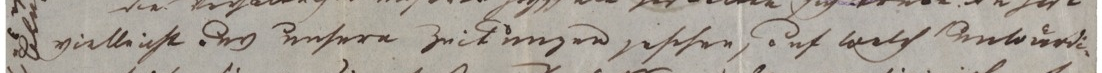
vielleicht aus unsern Zeitungen gesehen, auf welch unwürdi-
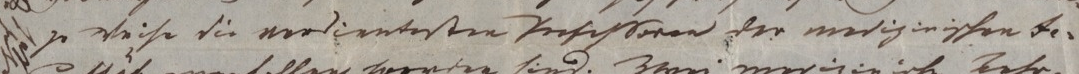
ge Weise die verdientesten Professoren der medizinischen Fa-
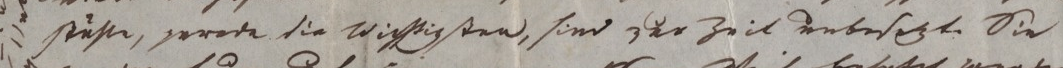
stühle, gerade die wichtigsten, sind zur Zeit unbesetzt. Sie
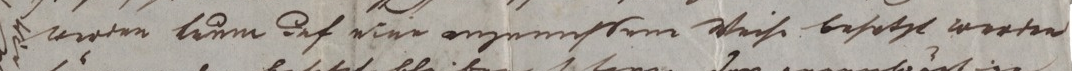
werden kaum auf eine angemessene Weise besetzt werden
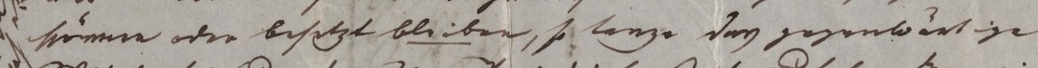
können oder besetzt bleiben, so lange das gegenwärtige
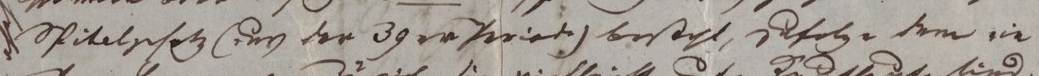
Spitalgesetz (aus der 39er Periode) besteht, zufolge dem ein
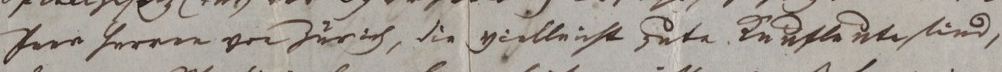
Paar Herren von Zürich, die vielleicht gute Kaufleute sind,
